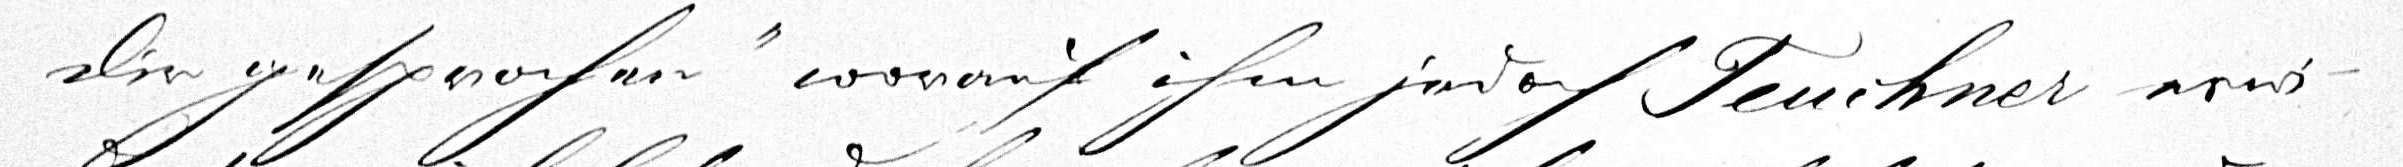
dir gesprochen“ worauf ihm jedoch Teuchner erwi¬
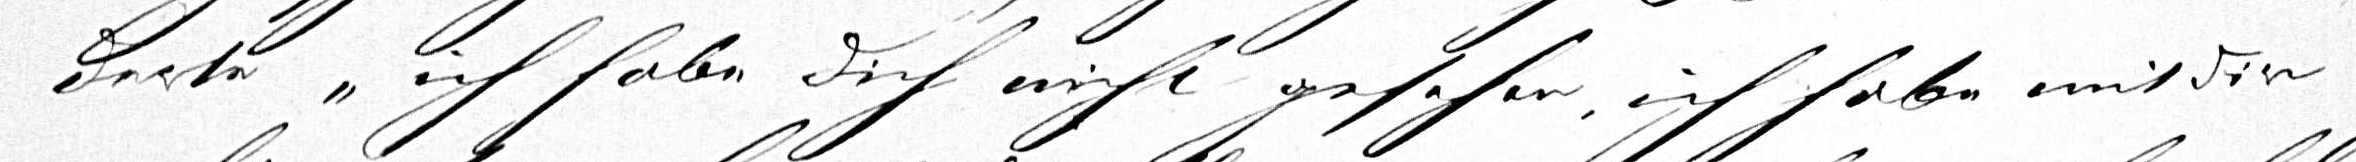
derte „ich habe dich nicht gesehen, ich habe mit dir
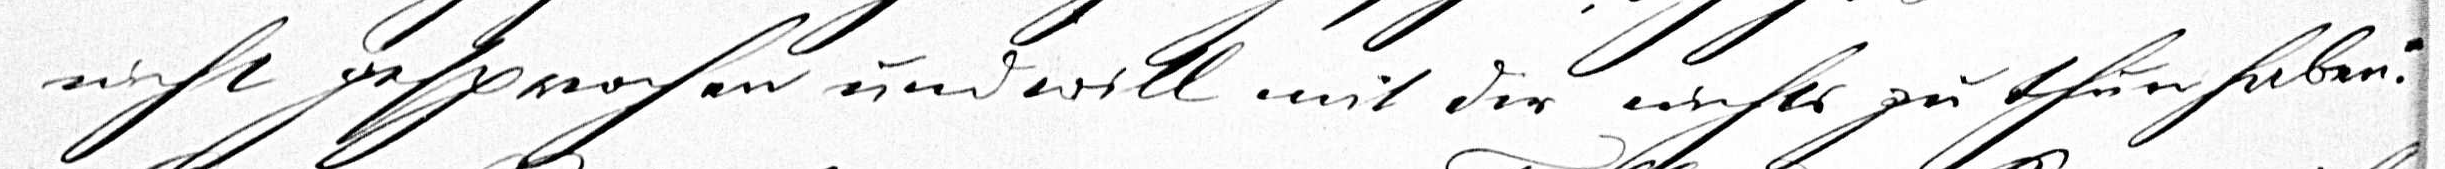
nicht gesprochen und will mit dir nichts zu thun haben.“
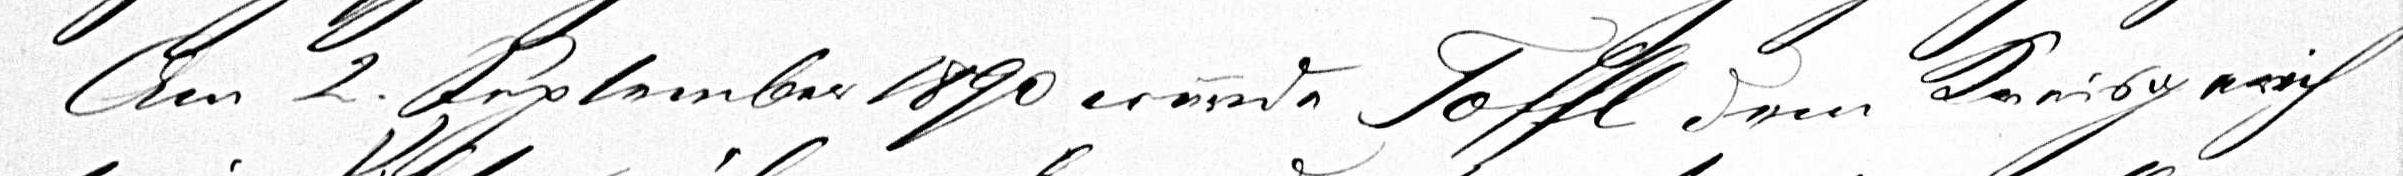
Am 2. September 1890 wurde Toffl dem Kreisgerich¬
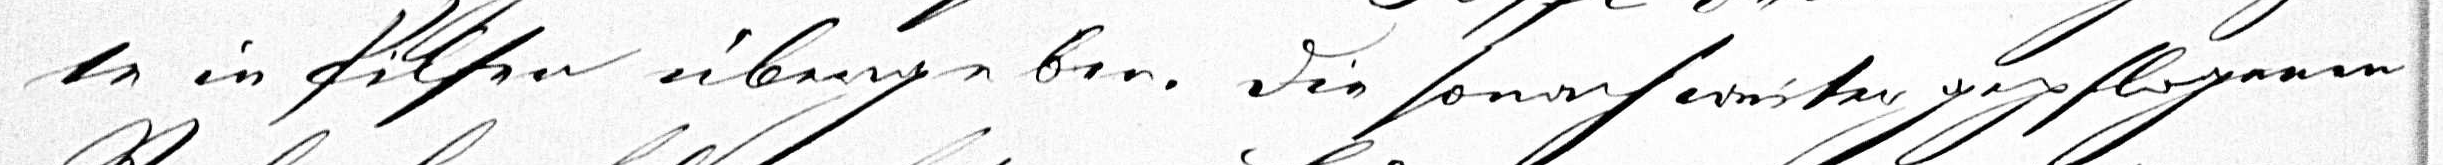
te in Pilsen übergeben. Die sonach weiter gepflogenen
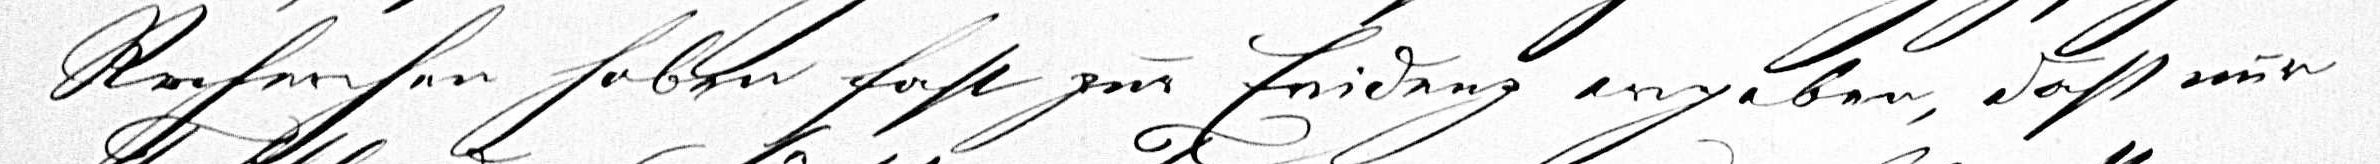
Recherchen haben fast zu Evidenz ergeben, daß nur
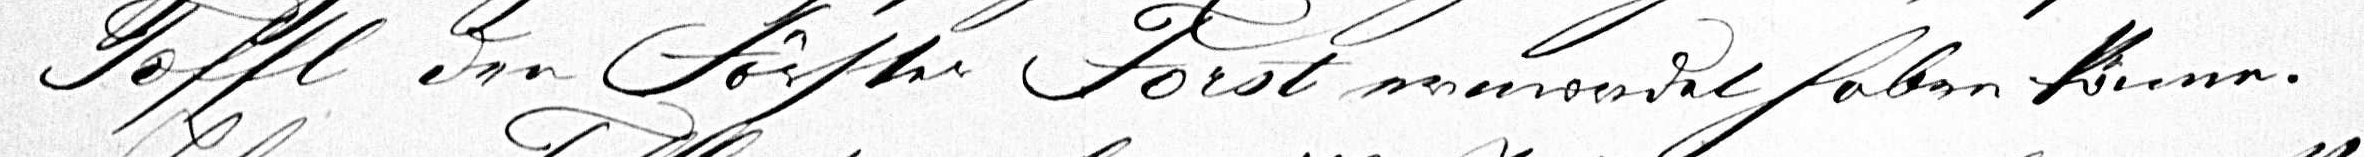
Toffl der Förster Forst ermordet haben könne.
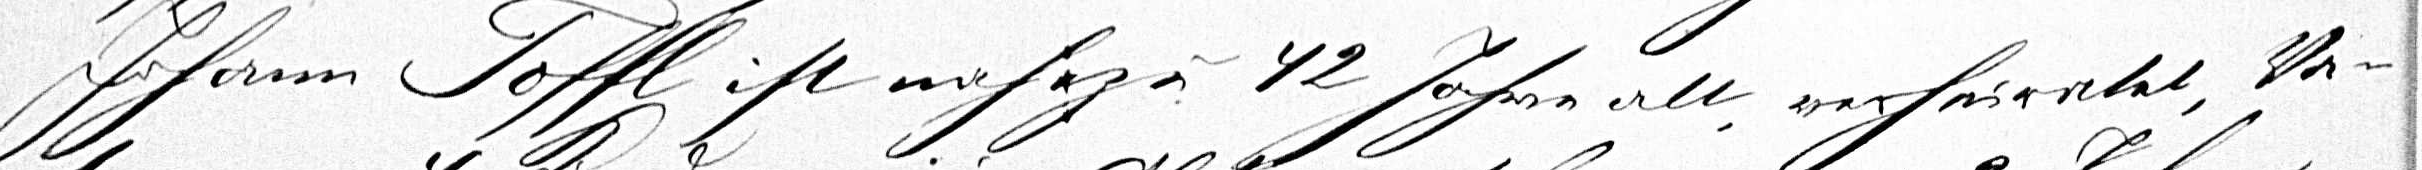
Johann Toffl ist nahezu 42 Jahre alt, verheiratet, Va¬
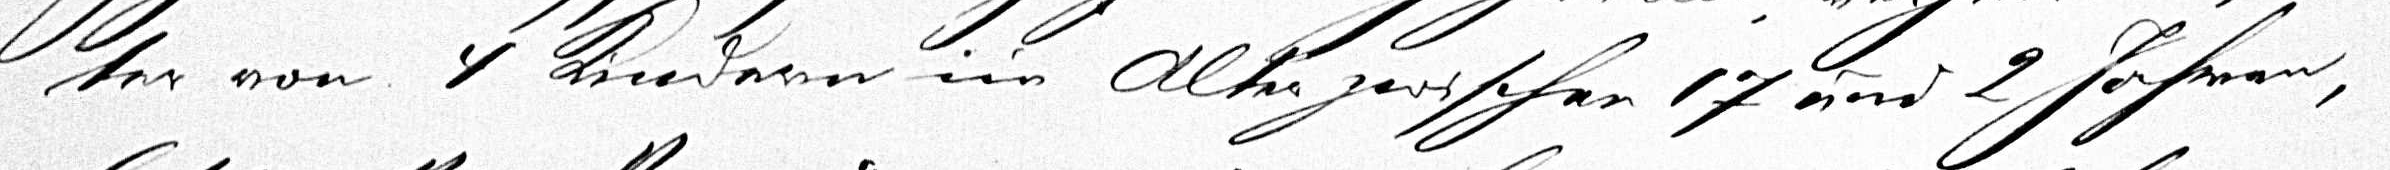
ter von 4 Kindern im Alter zwischen 17 und 2 Jahren,
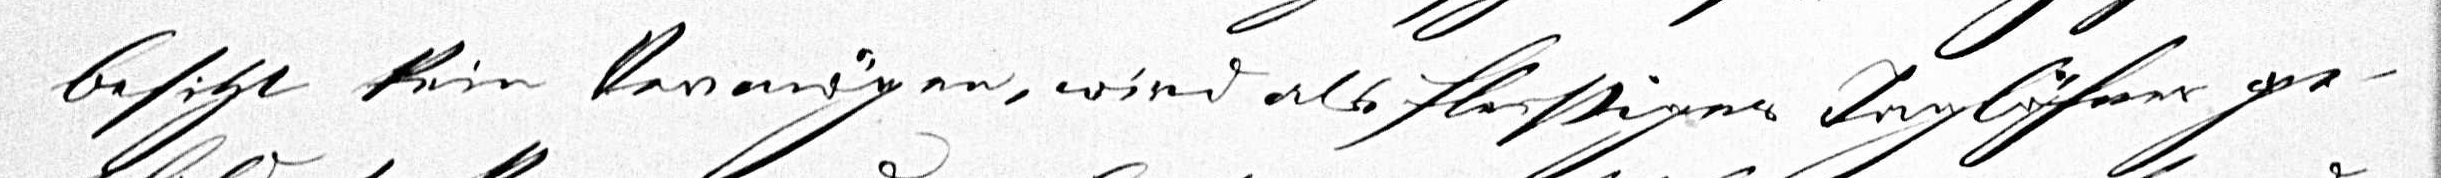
besitzt kein Vermögen, wird als fleißiger Taglöhner ge¬
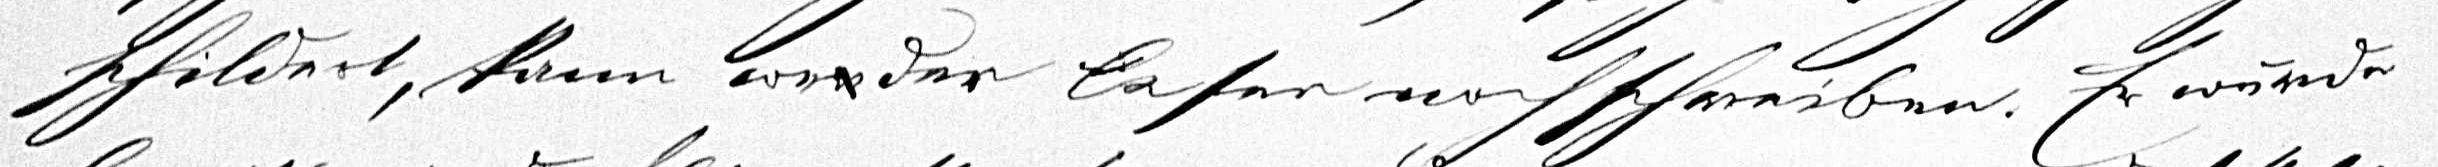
schildert, kann weder lesen noch schreiben. Er wurde
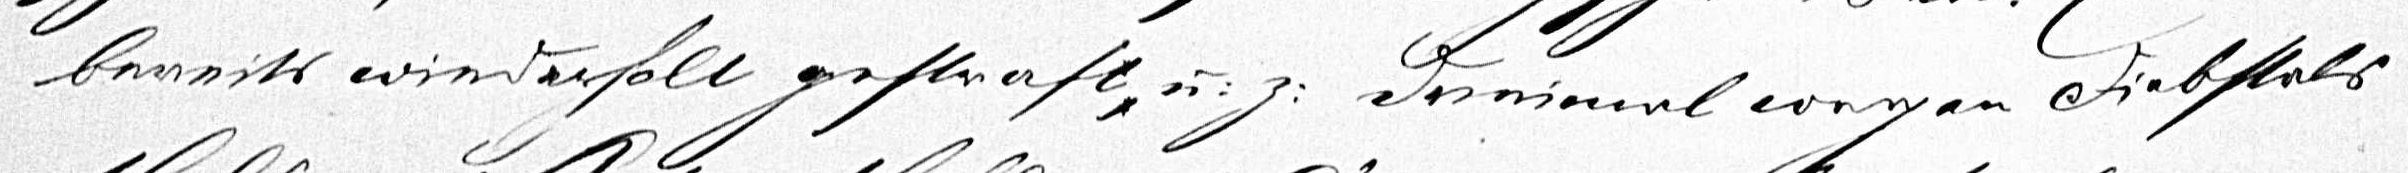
bereits wiederholt gestraft, u. z. dreimal wegen Diebstahls
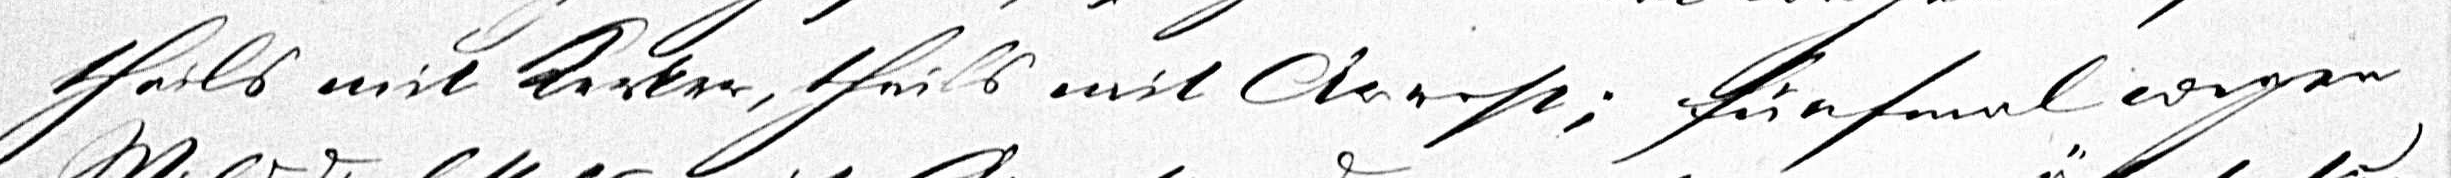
theils mit Kerker, theils mit Arrest; fünfmal wegen
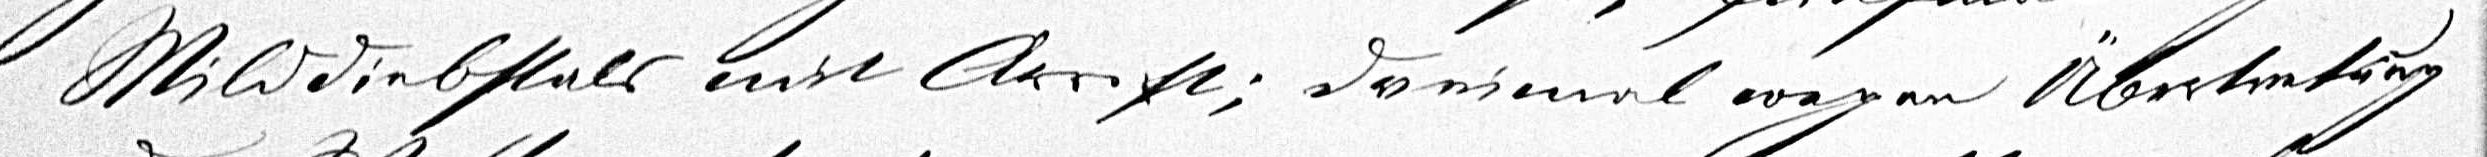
Milddiebstals mit Arrest; dreimal wegen Übertretung
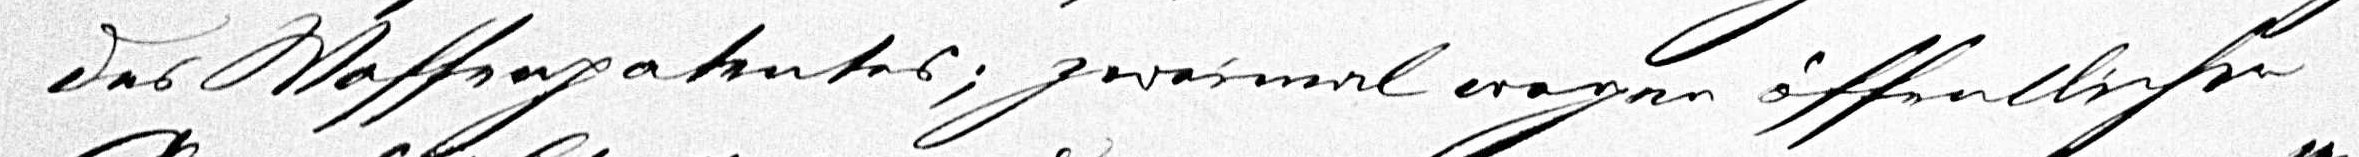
des Waffenpatentes; zweimal wegen öffentliche
